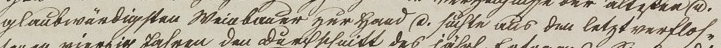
glaubwürdigsten Weinbauer zur Hand &. suchte aus den letztverflos-
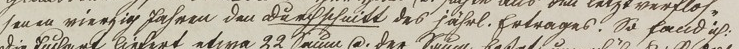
senen vierzig Jahren den Durchschnitt des jährl. Ertrages. So fand ich:
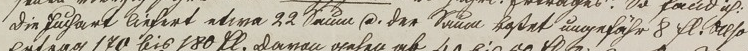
die Juchart liefert etwa 22 Saum &. der Saum kostet ungefähr 8 fl. Also
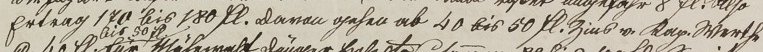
Ertrag 170 bis 180 fl. Davon gehen ab 40 bis 50 fl. Zins v. Rap. Werthe
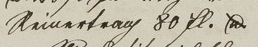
Reinertrag 80 fl. u.
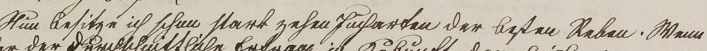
Nun besitze ich schon stark zehen Jucharten der besten Reben. Wenn
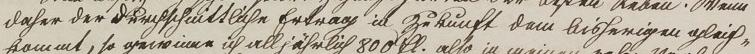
daher der Durchschnittliche Ertrag in Zukunft dem bisherigen gleich-
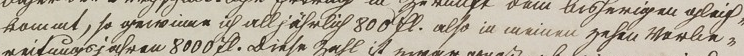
kommt, so gewinne ich alljährlich 800 fl. also in meinen zehen Vorbe-
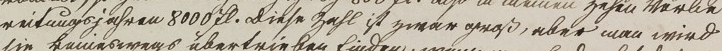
reitungsjahren 8000 fl. Diese Zahl ist zwar groß, aber man wird
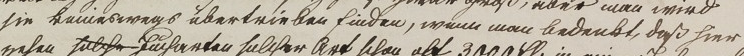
sie keineswegs übertrieben finden, wenn man bedenkt, daß hier
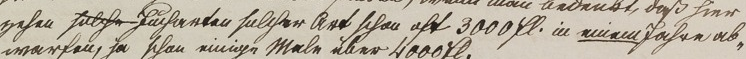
zehen solche Jucharten solcher Art schon oft 3000 fl. in einem Jahre ab-
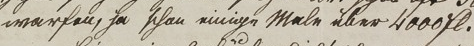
warfen, ja schon einige Male über 4000 fl.
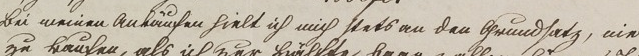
Bei meinen Ankäufen hielt ich mich stets an den Grundsatz, nie
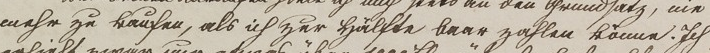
mehr zu kaufen, als ich zur Hälfte baar zahlen könne. Ich
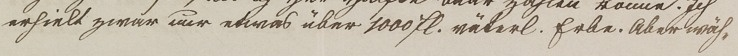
erhielt zwar nur etwas über 1000 fl. väterl. Erbe. Aber wäh-
